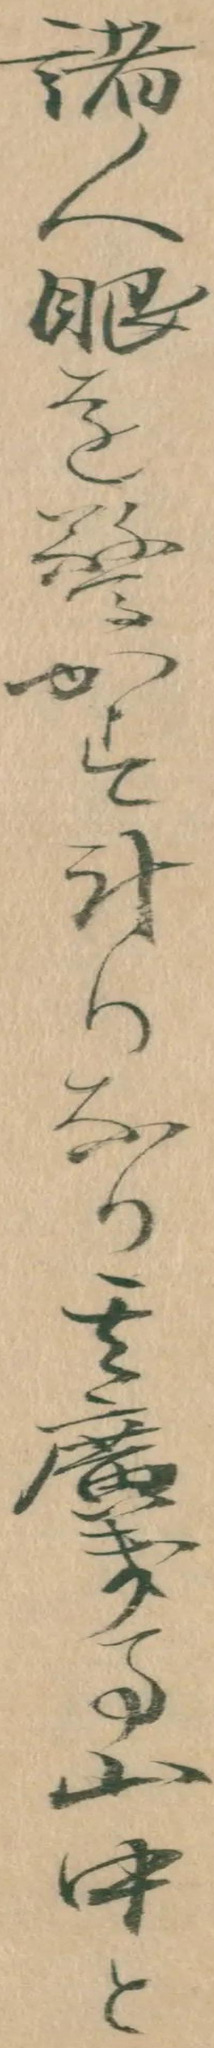諸人眼を驚かす計りなり其広き事山中と
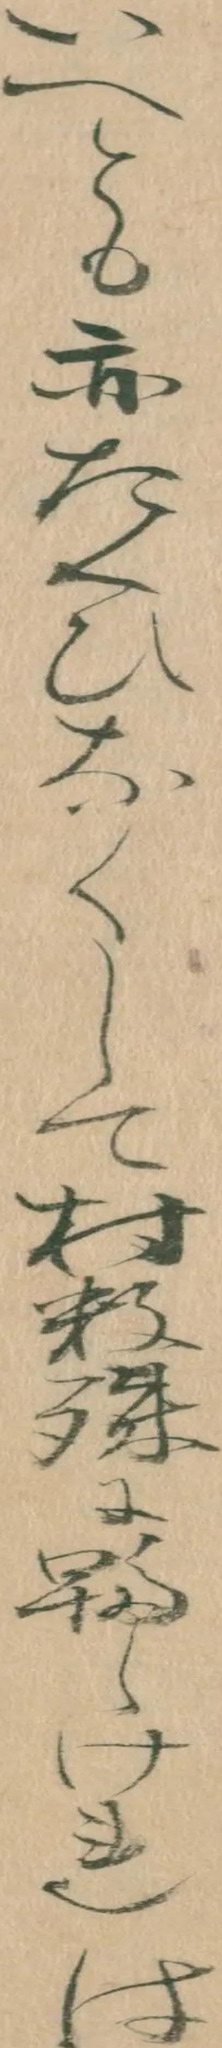いへとも亦たくひなくして村数殊に夥しけれは
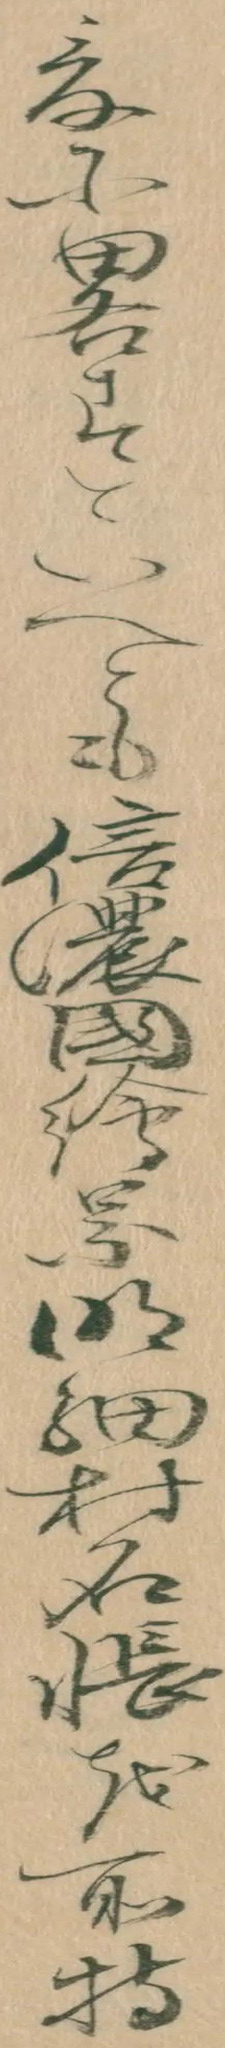爰に略すといへとも信濃国絵図明細村名帳を所持
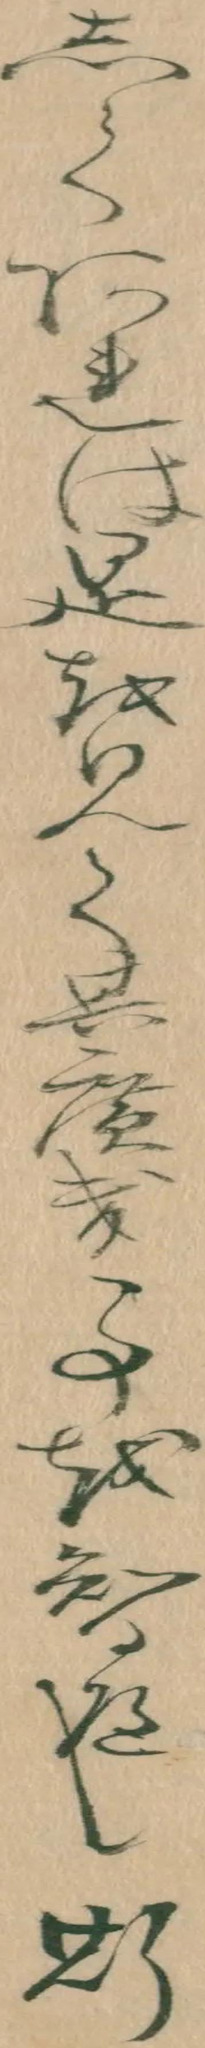してあれは是を見て其広き事を知るへし斯
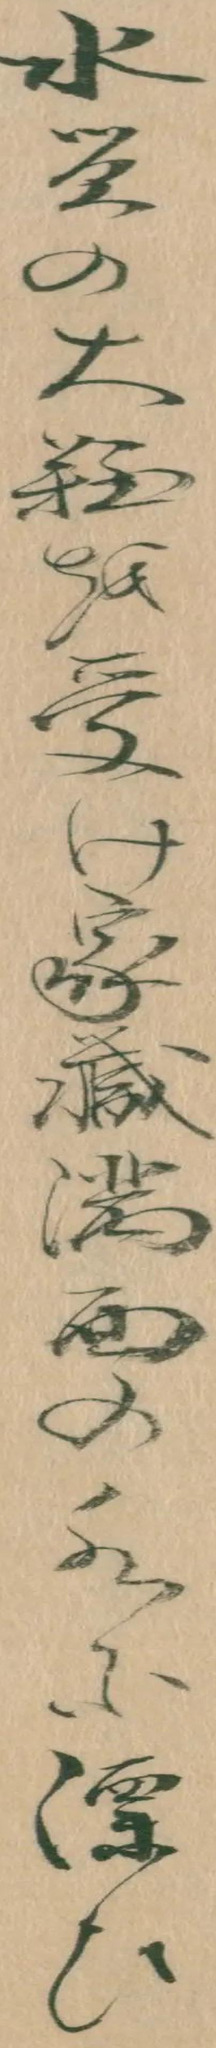水災の大難を受け家蔵満面の水に漂ひ
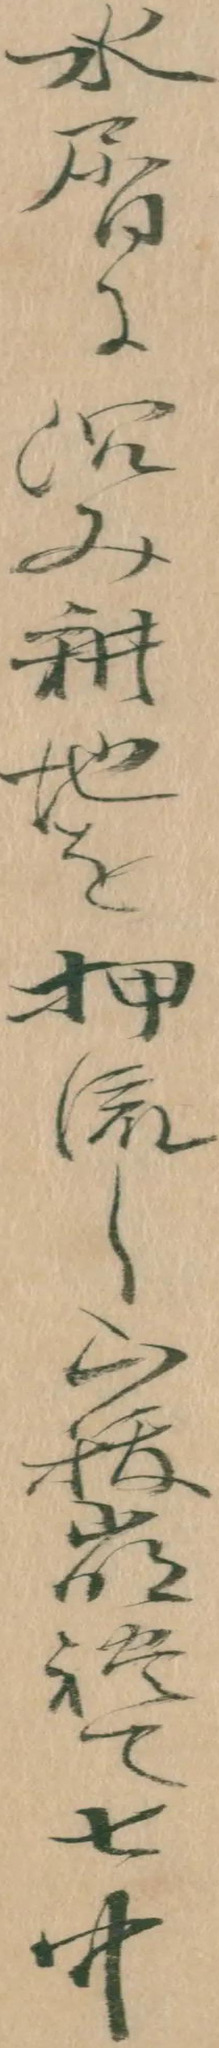水屑に沉み耕地を押流し山抜崩れて土中
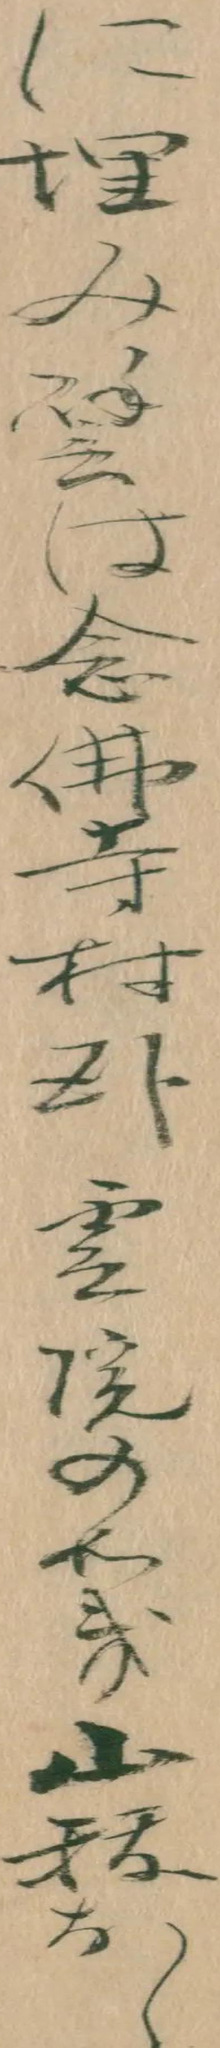に埋み譬は念佛寺村臥雲院の如き山抜おし
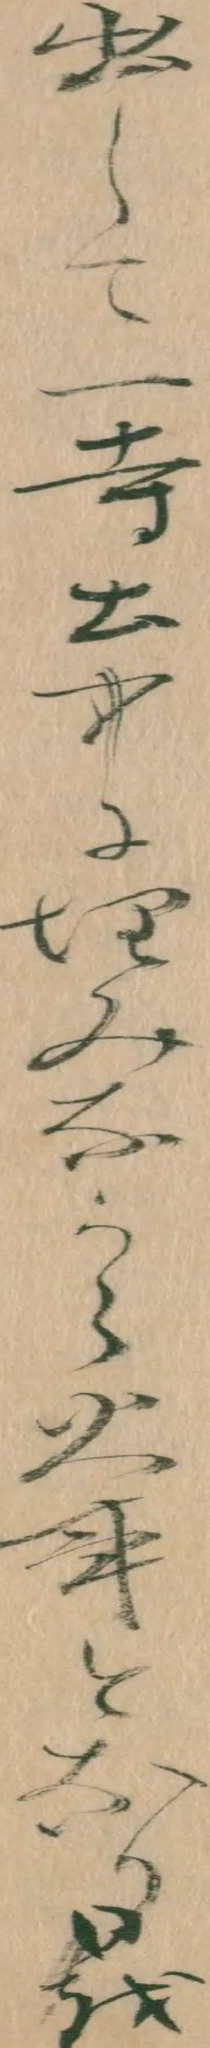出して一寺土中に埋みなから火事となり日を
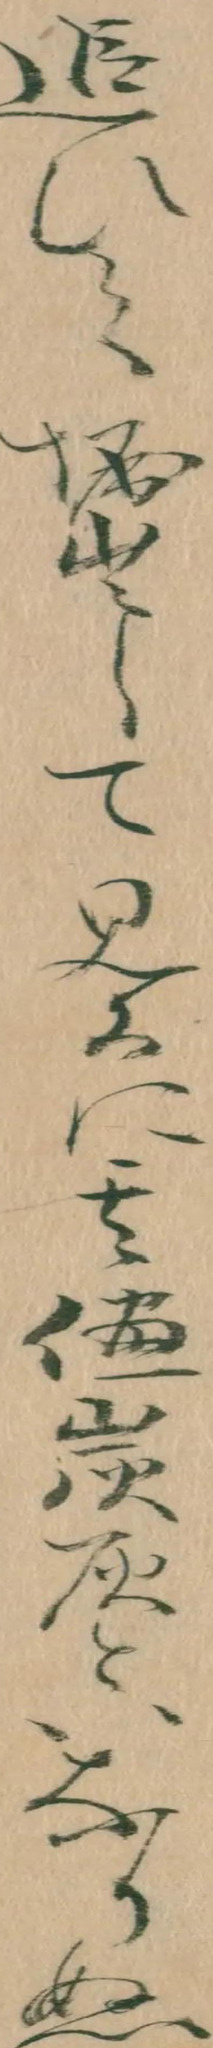追ひて掘出して見るに其侭炭灰といなりぬ
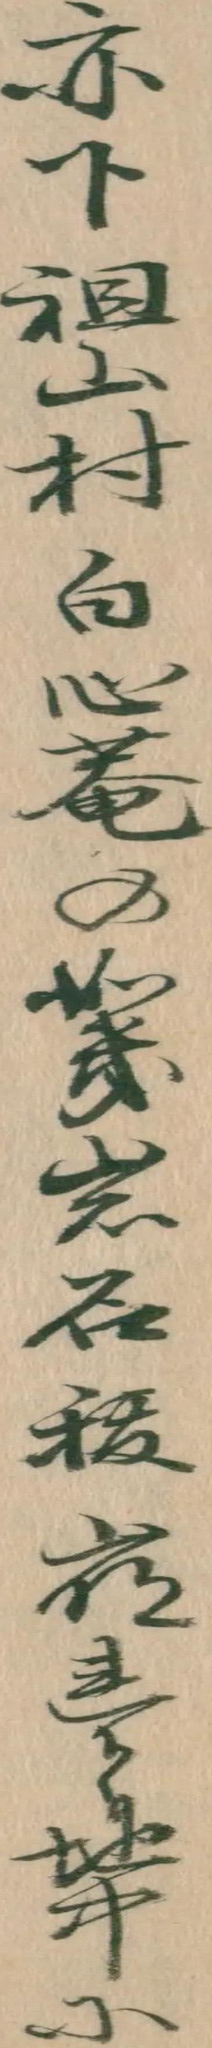亦下祖山村白心庵の如き岩石抜崩れて地中に
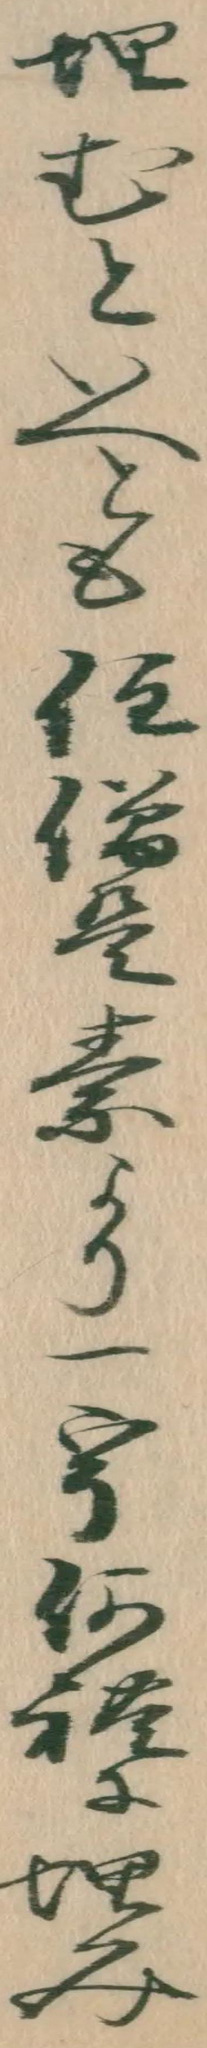埋むといへとも住僧是素より一宇何れに埋み
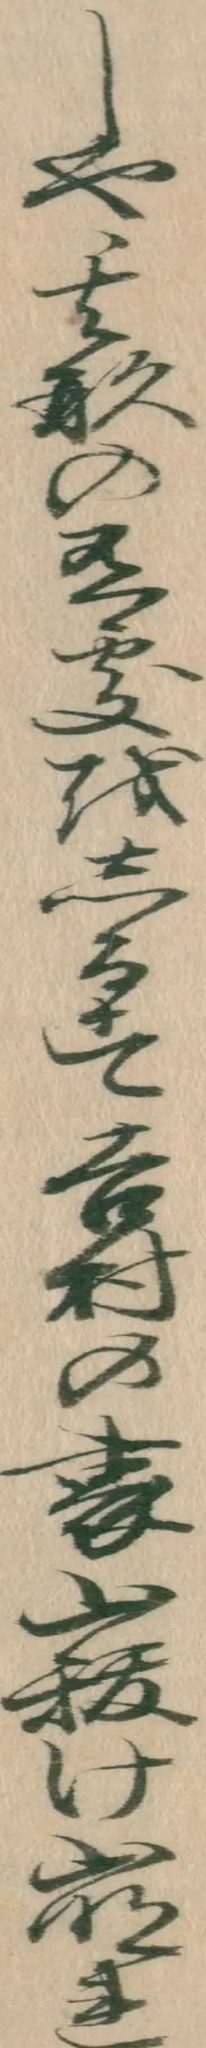しや其形の有處をしるす吉村の裏山抜け崩れ
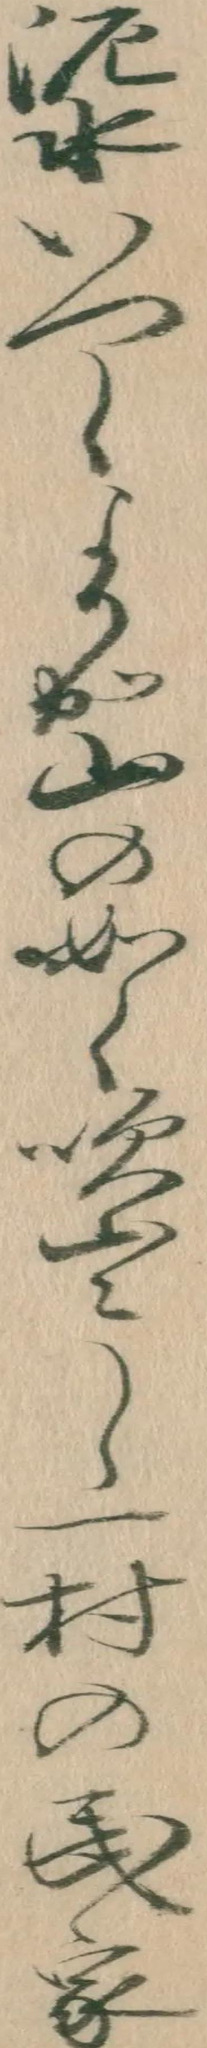泥水いつしよりか山の如く吹出し一村の民家
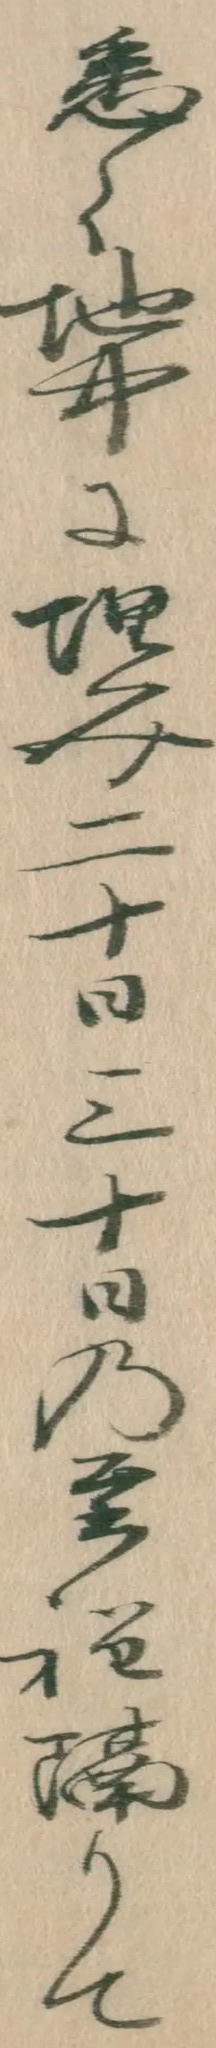悉く地中に埋み二十日三十日の至程隔りて
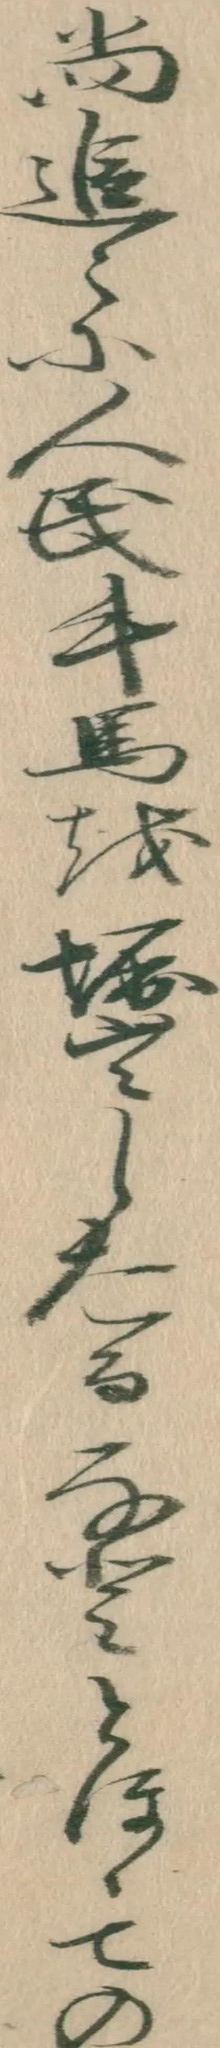尚追々に人民牛馬を掘出したるなととほゝこの

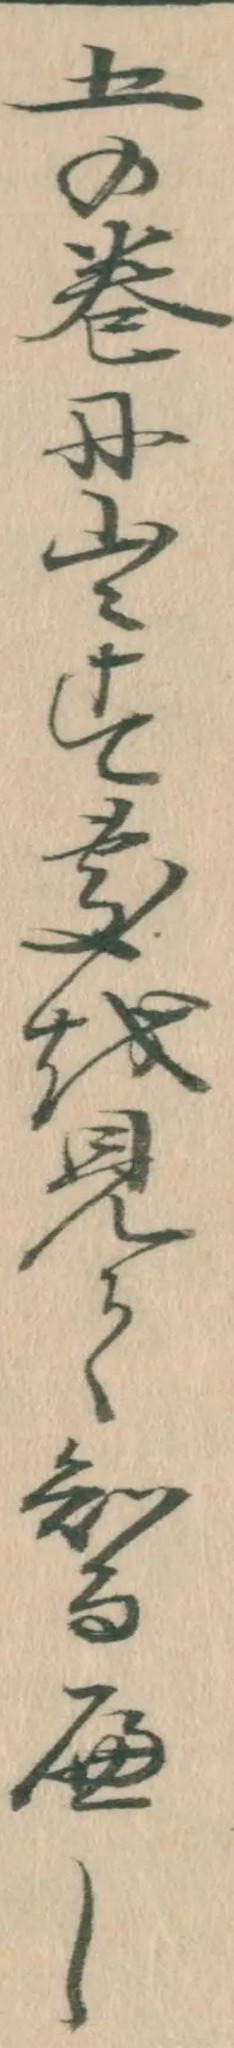五の巻に出す處を見て知るへし
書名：俗語之種. [7]
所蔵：国立国会図書館 National Diet Library, JAPAN
